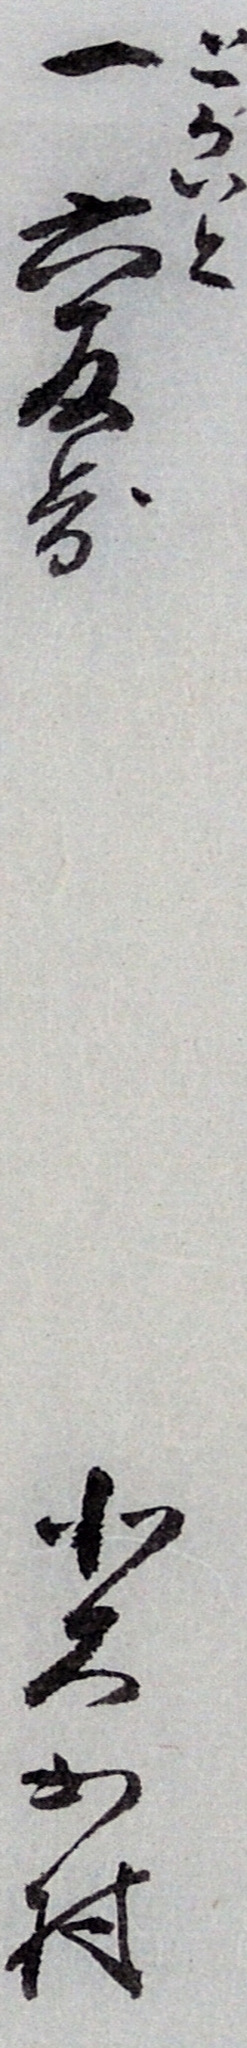一六反歩北大出村
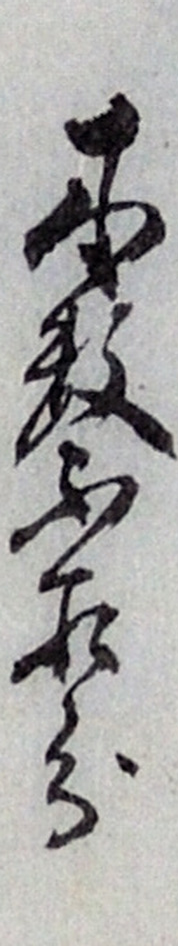木数不相分
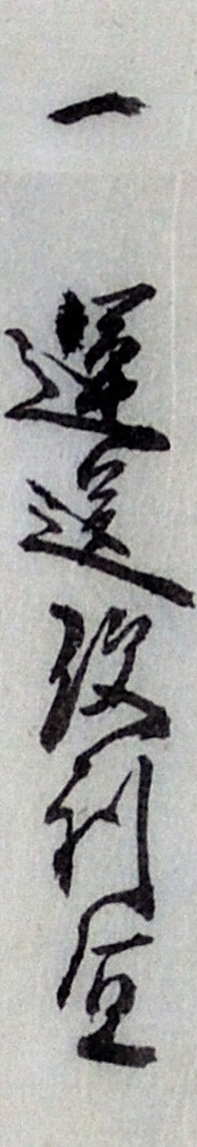一運送便利宜
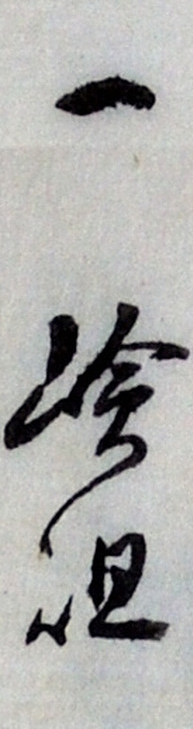一嶮岨
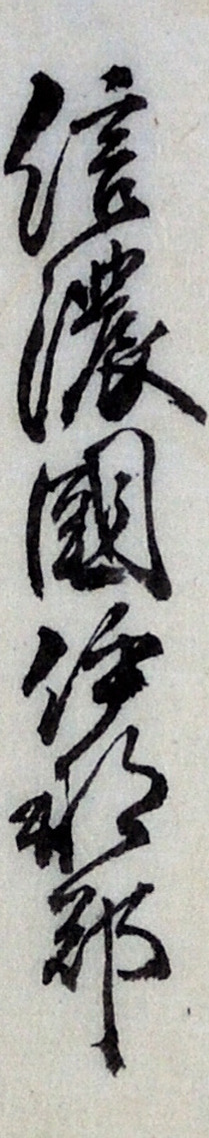信濃国伊那郡
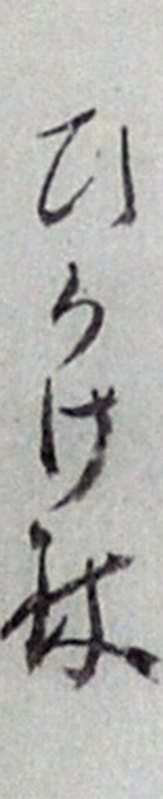ひかけ林
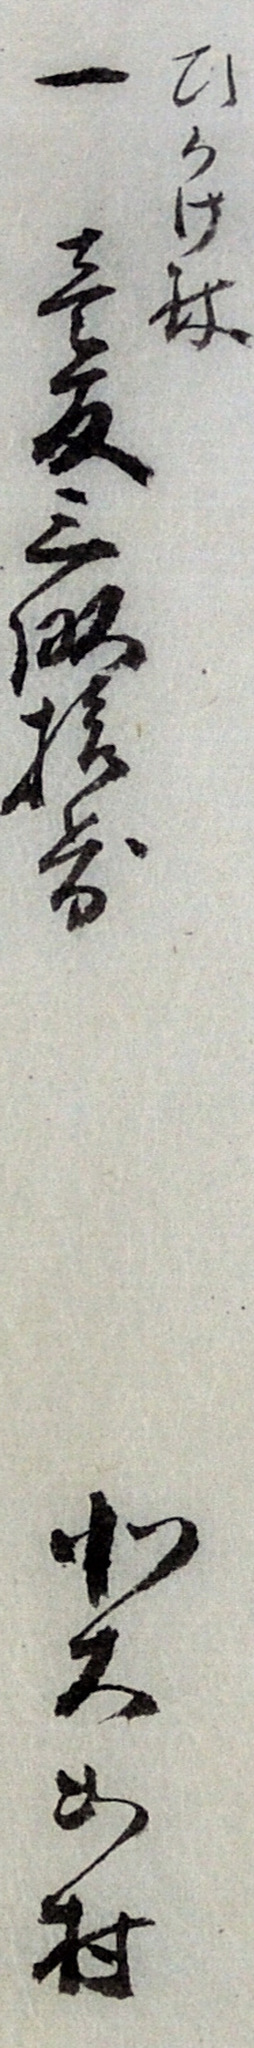一壱反三㽗拾歩北大出村
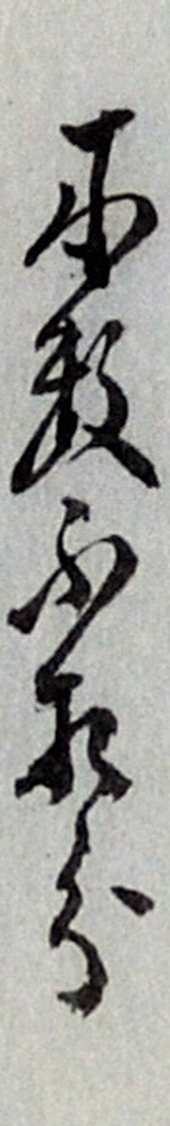木数不相分
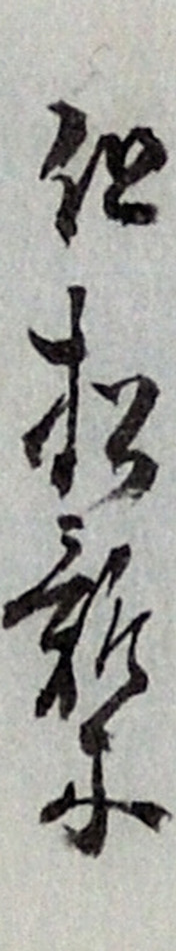但松雑木
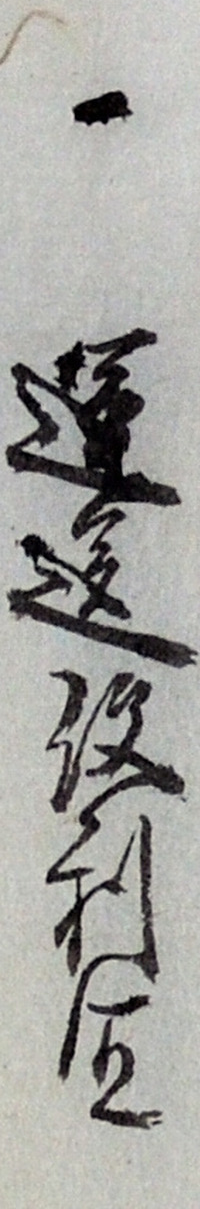一運送便利宜
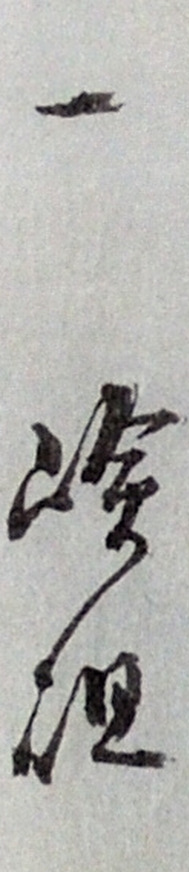一嶮岨
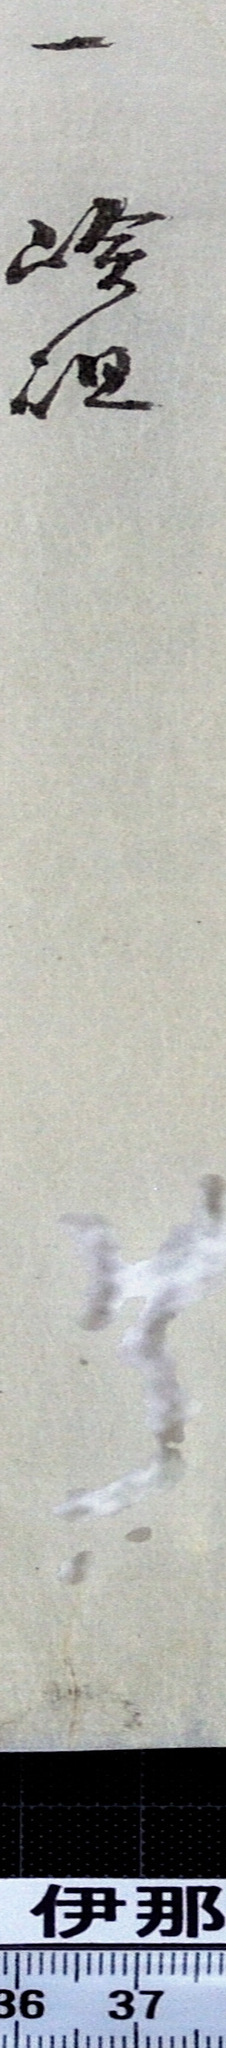一嶮岨

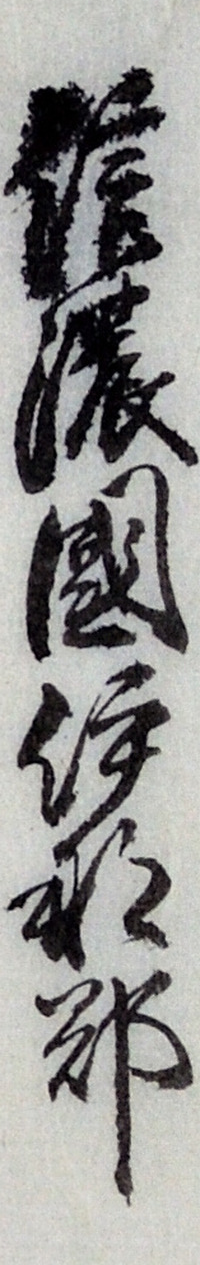信濃国伊那郡
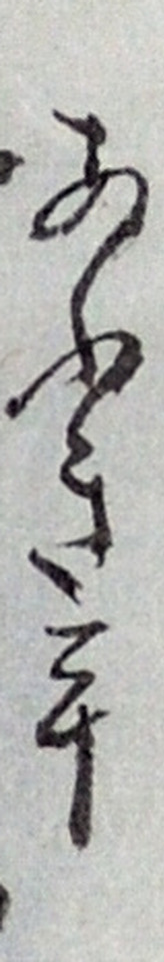あふき平
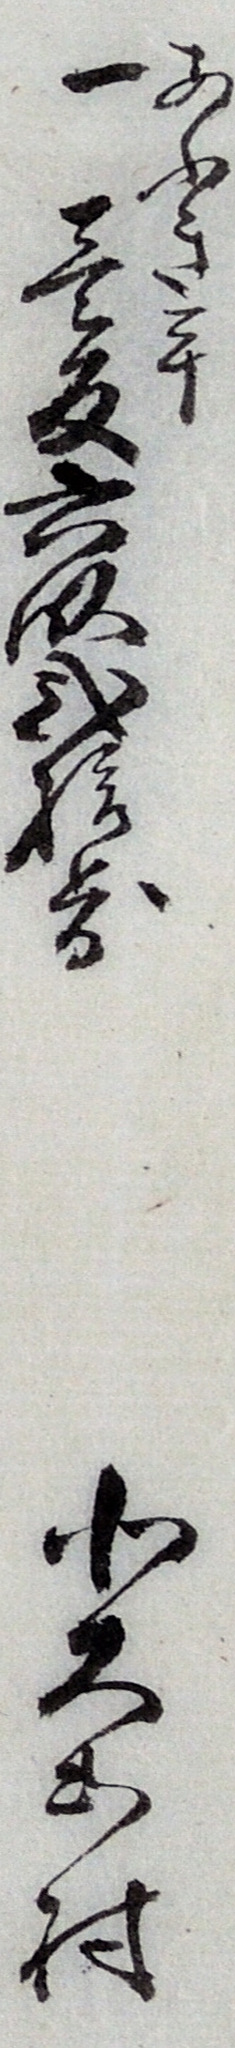一壱反六㽗弐拾歩北大出村
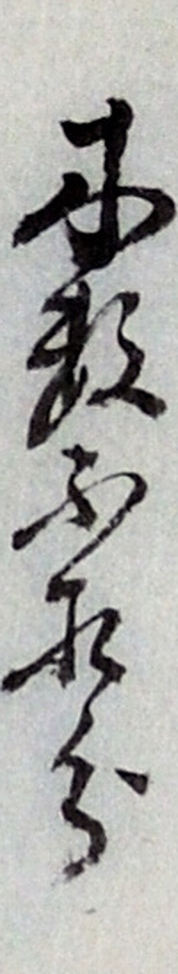木数不相分
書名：官林反別帳
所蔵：伊那市立高遠町図書館・合同会社AMANE
